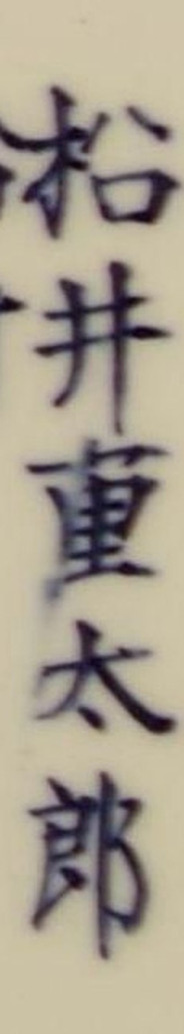松井重太郎
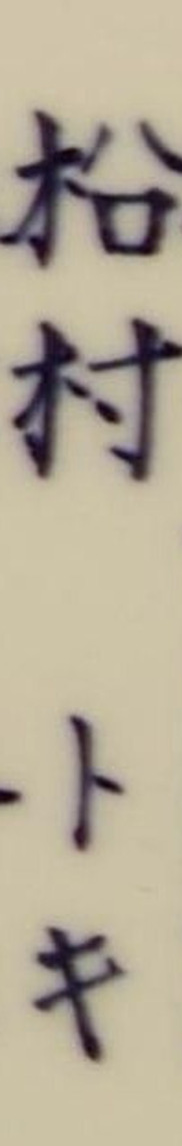松村トキ
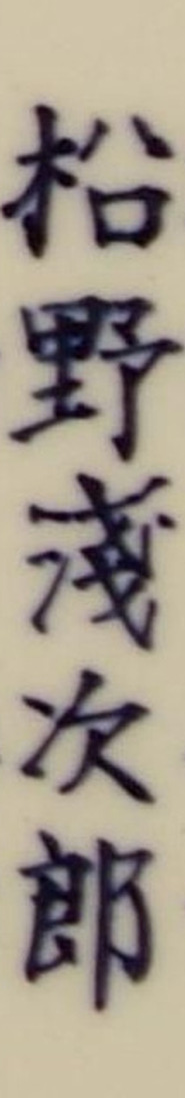松野茂次郎
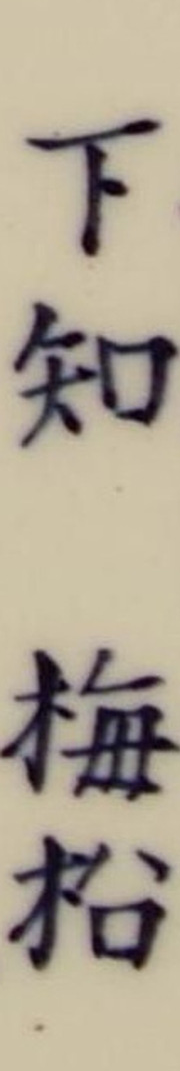下知梅松
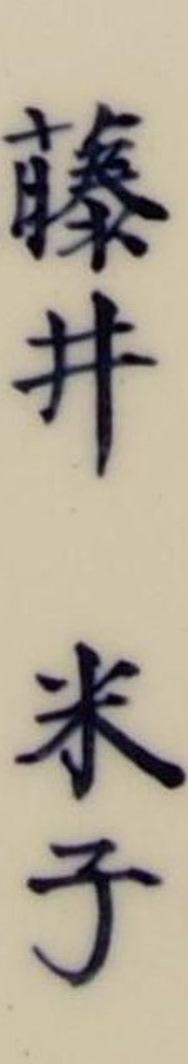藤井米子
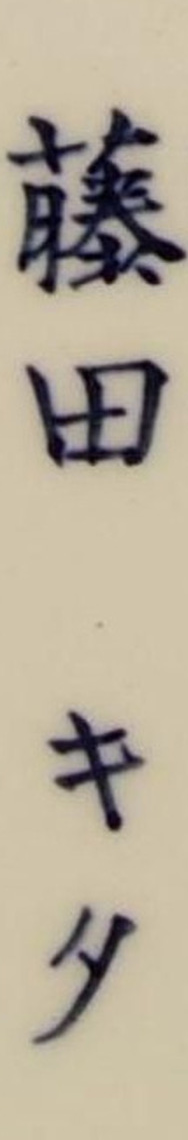藤田キタ
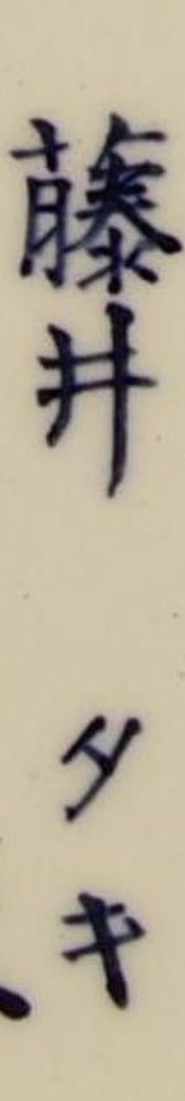藤井タキ
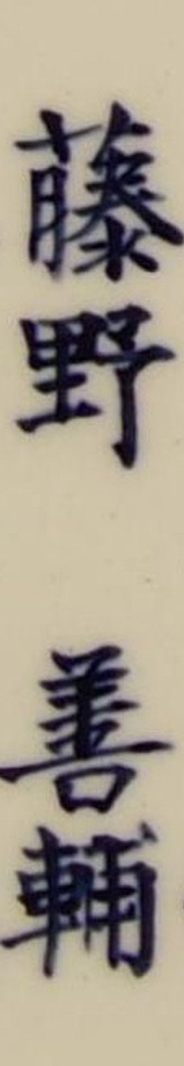藤野善輔
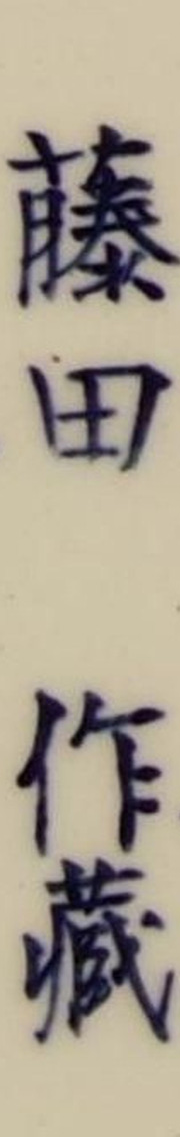藤田作蔵
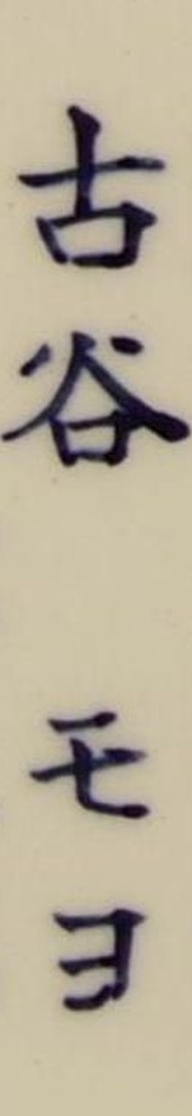古谷モヨ
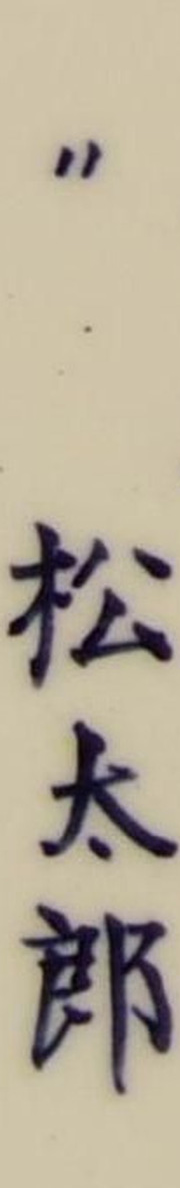松太郎
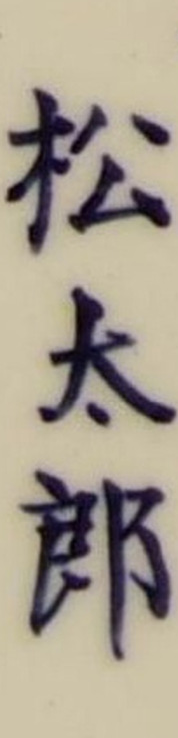松太郎
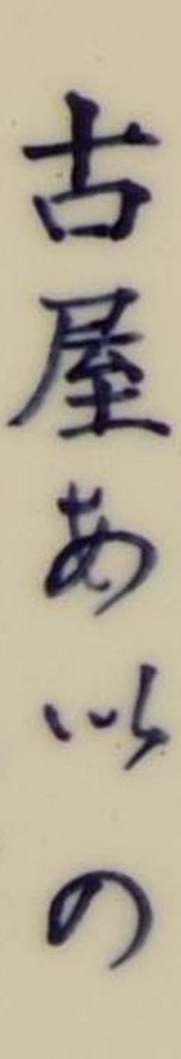古屋あいの
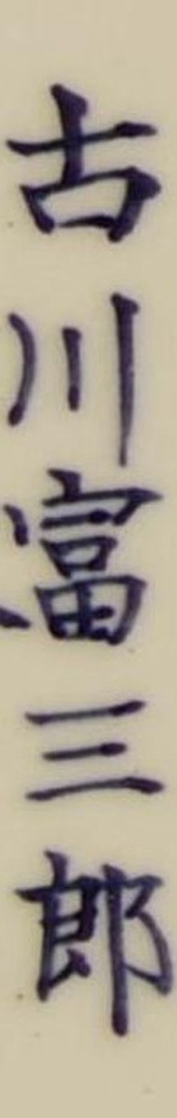古川富三郎
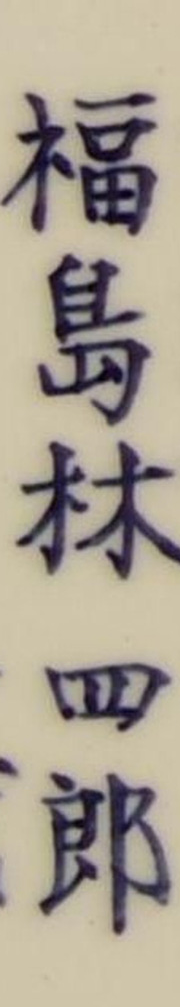福島林四郎
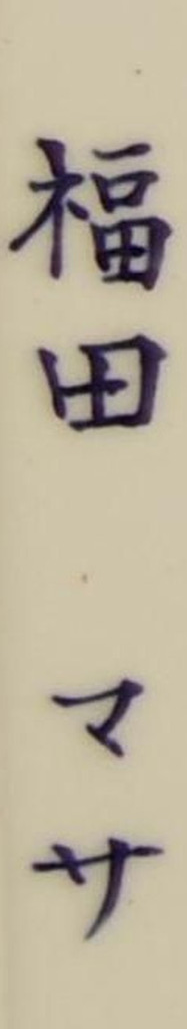福田マサ
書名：E~L
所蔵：高野山金剛峯寺
